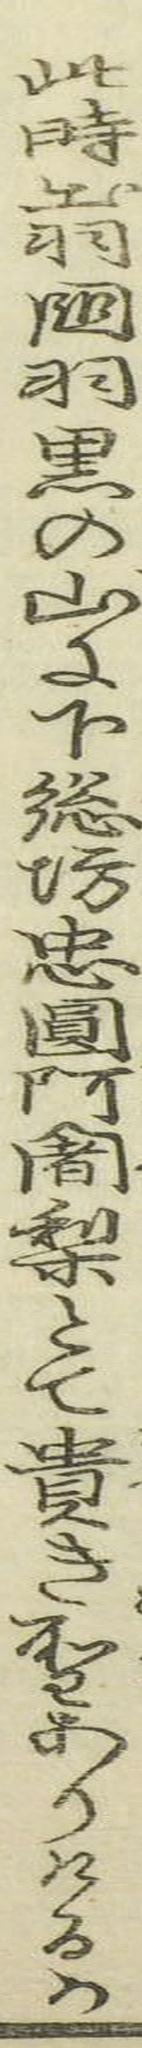此時出羽国羽黒の山に下総坊忠円阿闍梨とて貴き聖ありけるか
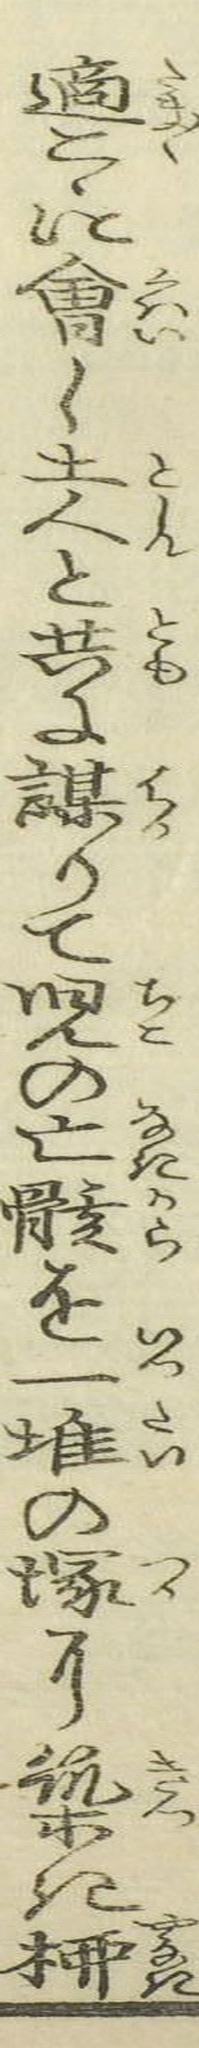適こゝに会し土人と共に謀りて児の亡骸を一堆の塚に築き柳
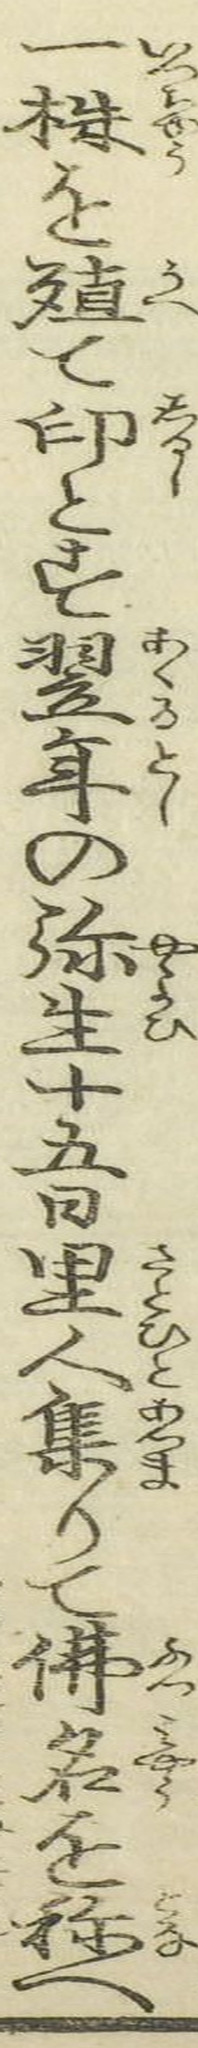一株を殖て印とす翌年の弥生十五日里人集りて仏名を称へ
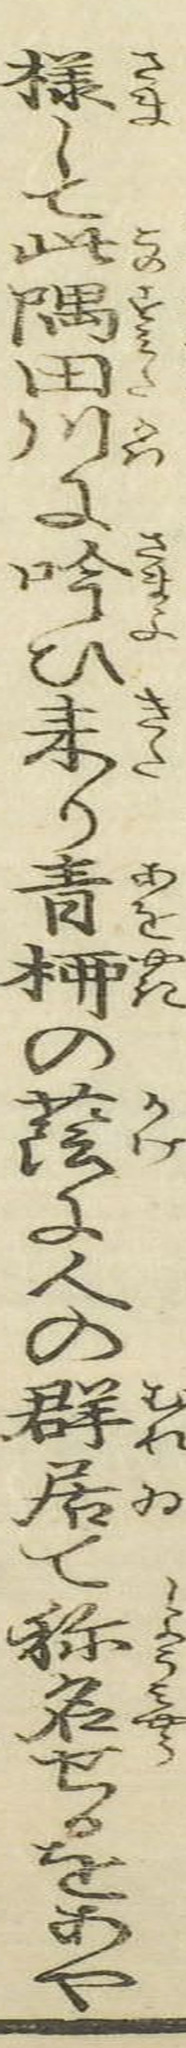様して此隅田川に吟ひ来り青柳の蔭に人の群居て称名せるをあや
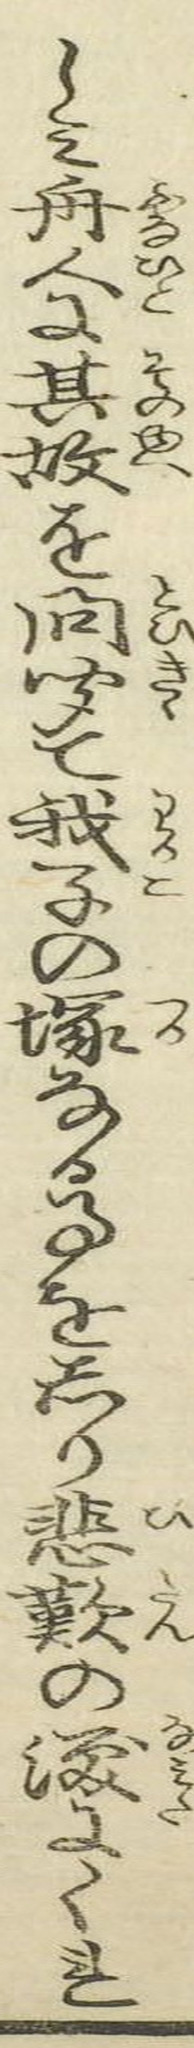しみ舟人に其故を問聞て我子の塚なる事をしり悲歎の涙にくれ
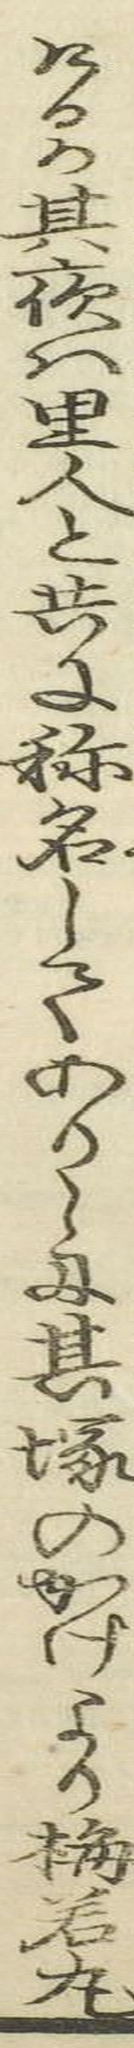けるか其夜は里人と共に称名してありしに其塚のかけより梅若丸
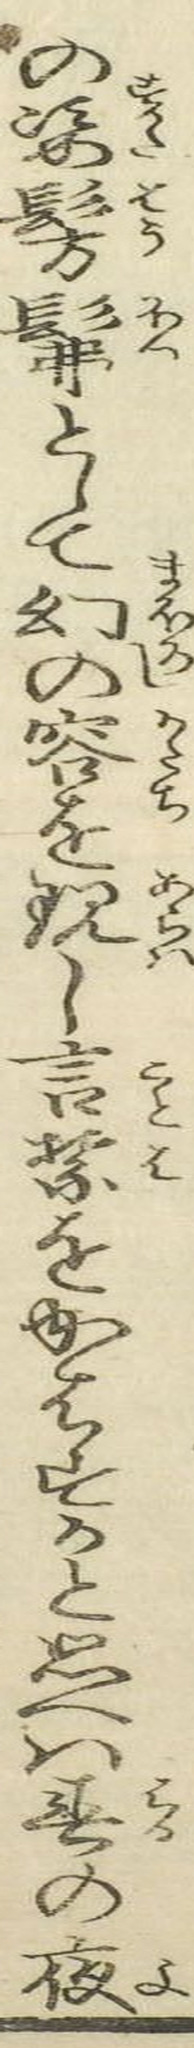の姿髣髴として幻の容を現し言葉をかはすかとと思へは春の夜
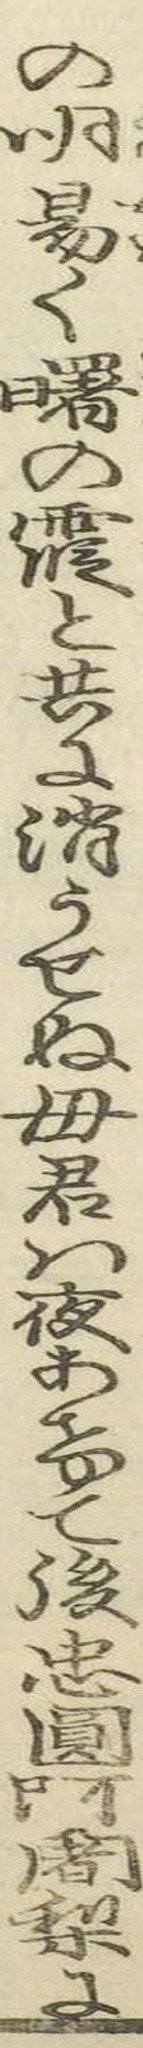の明易く曙の霞と共に消うせぬ母君は夜あけて後忠円阿闍梨に
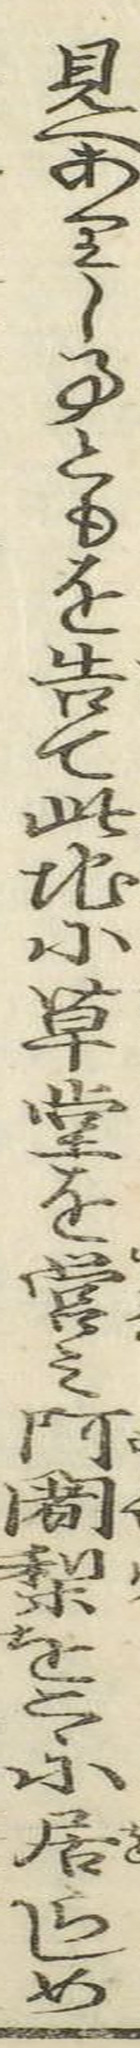見へありし事ともを告て此地に草堂を営み阿闍梨をこゝに居らしめ

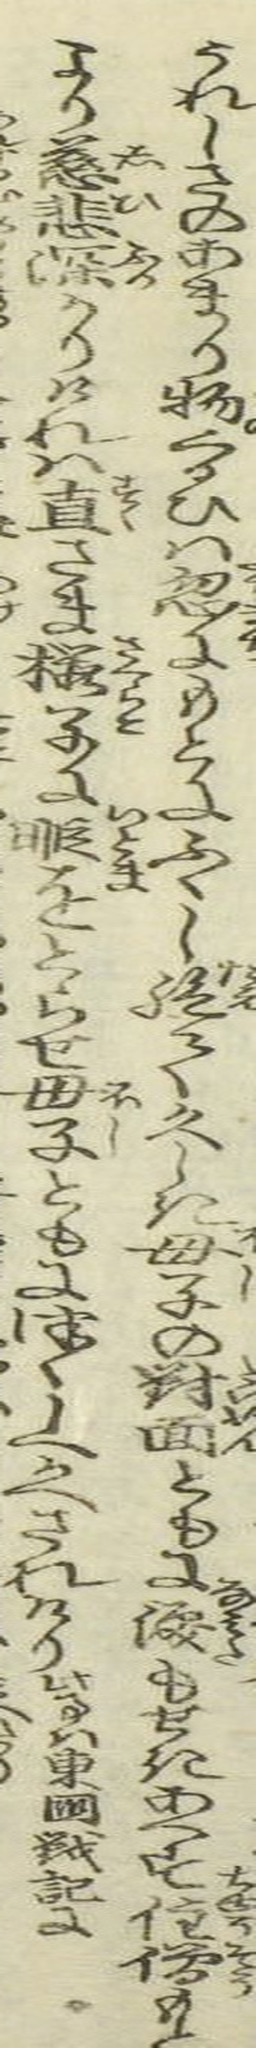より慈悲深かりけれは直さま桜子に暇をとらせ母子ともにつくしへかへされけり此事は東国戦記にみへたり
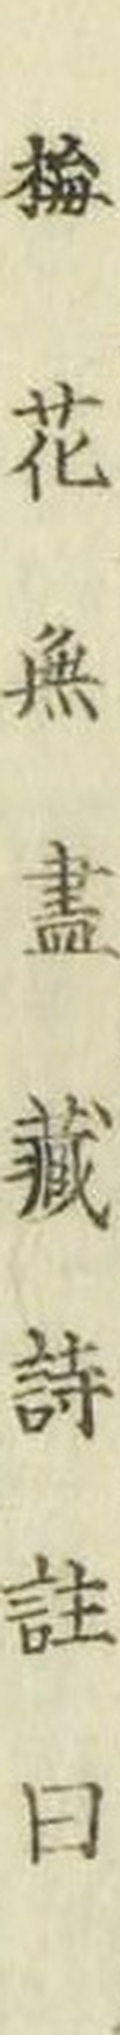梅花無尽蔵詩註曰
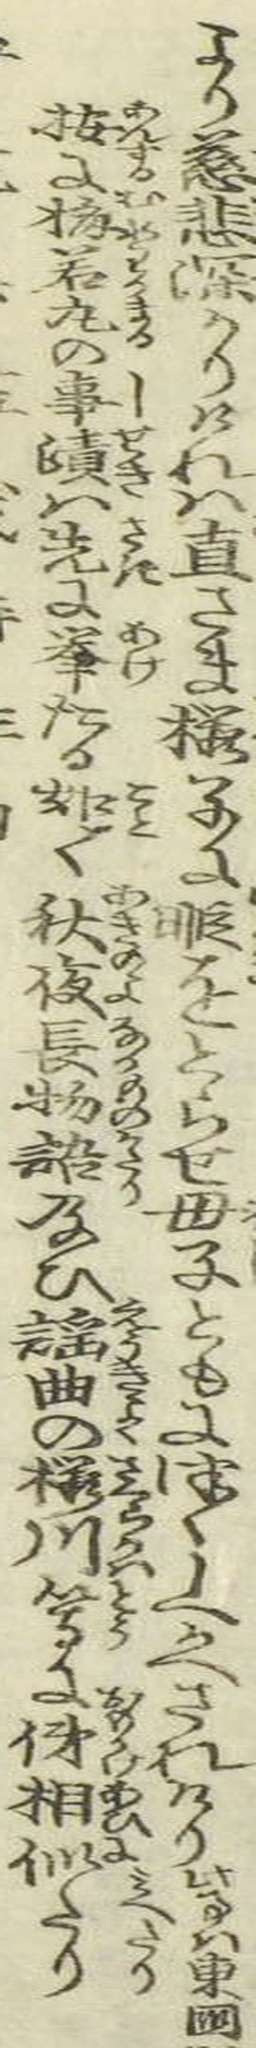按に梅若丸の事蹟は先に挙たる如く秋夜長物語及ひ謡曲の桜川等に俤相似たり
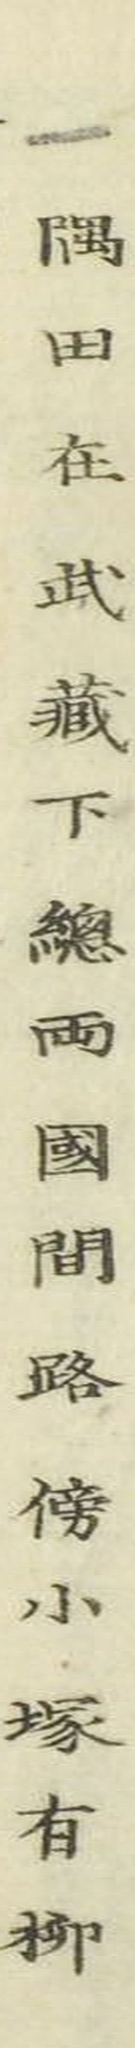隅田在武蔵下総両国間道傍小塚有柳
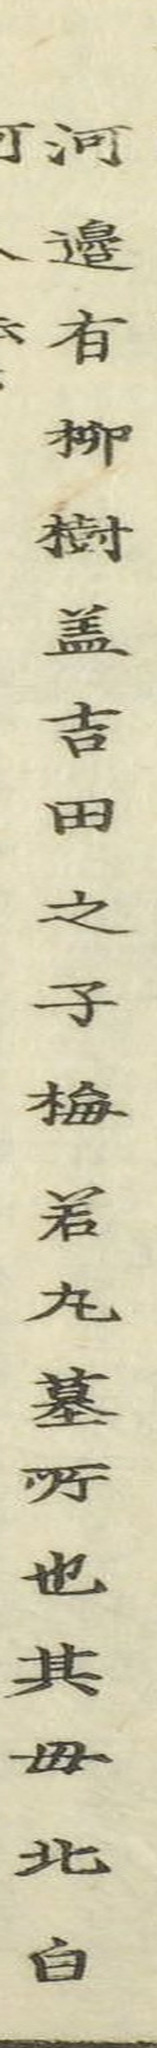河辺有柳樹盖吉田之子梅若丸墓所也其母北白
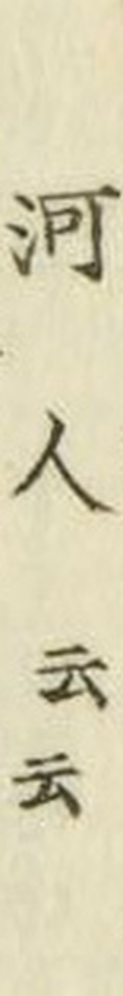河人云々
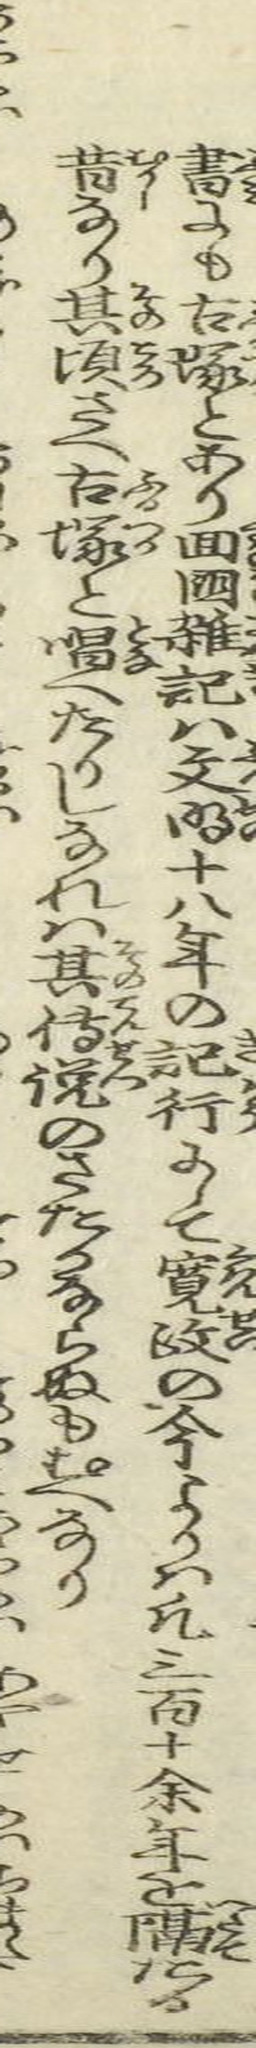昔なり其頃さへ古塚と唱へたりしなれは其伝説のさたかならぬもむへなり
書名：江戸名所図会 20巻 巻之19
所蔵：東京学芸大学教育コンテンツアーカイブ
